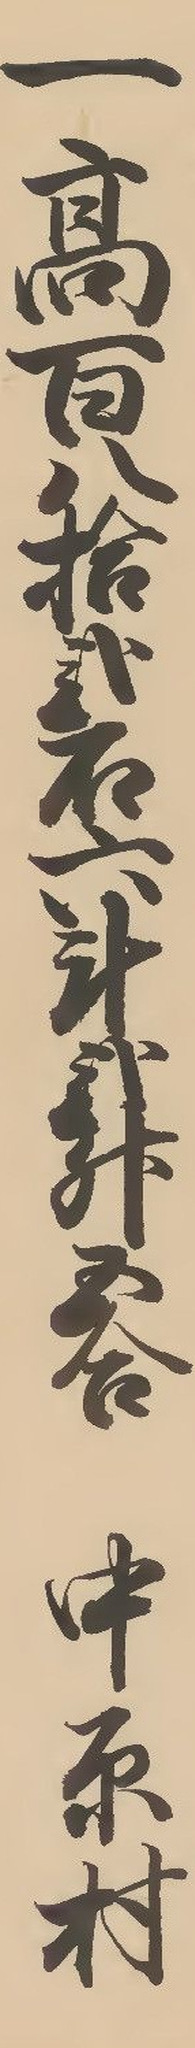一髙百八拾弐石六斗弐升五合中原村

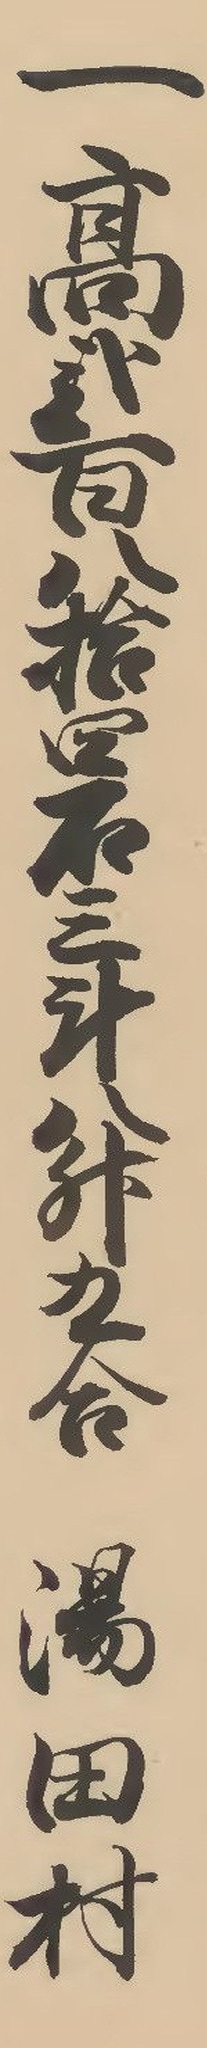一髙弐百八拾四石三斗八升九合湯田村
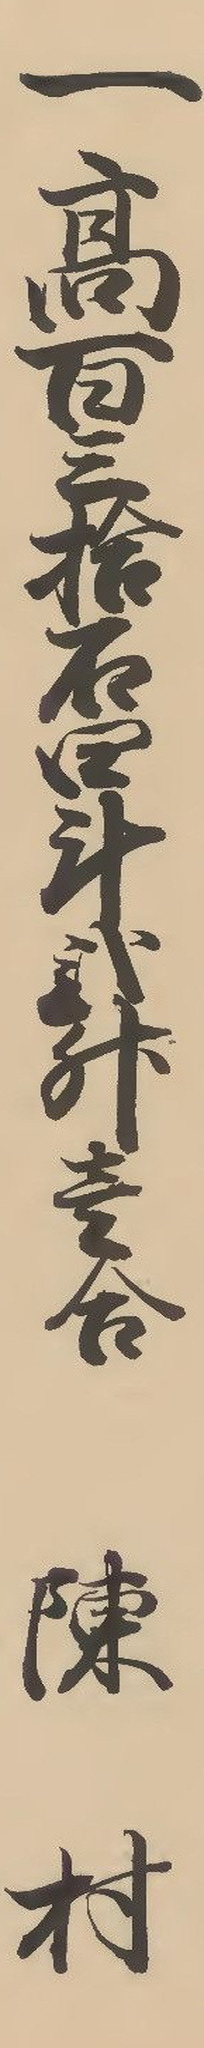一髙百三拾石四斗弐升壱合陳村
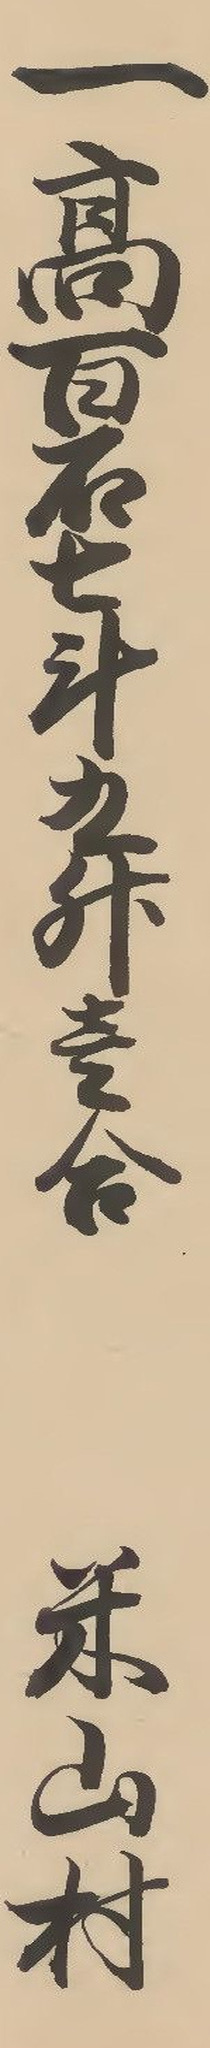一髙百石七斗九升壱合米山村
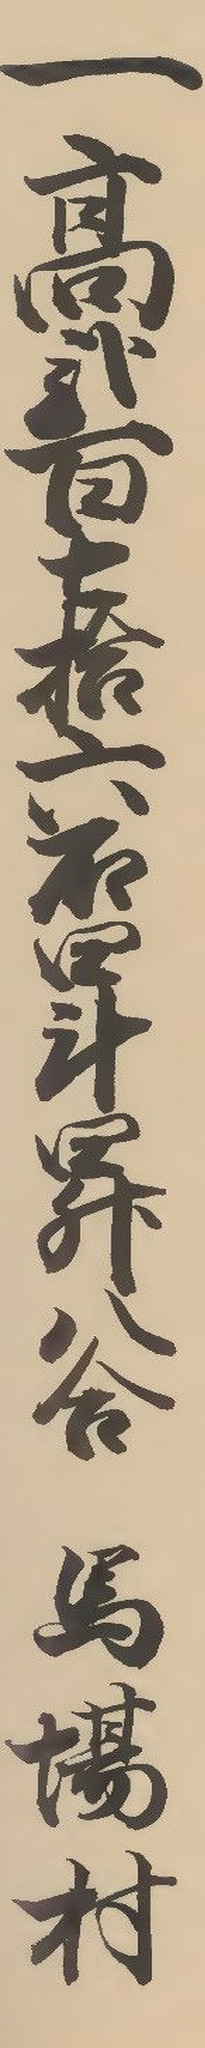一髙弐百七拾六石四斗四升八合馬場村
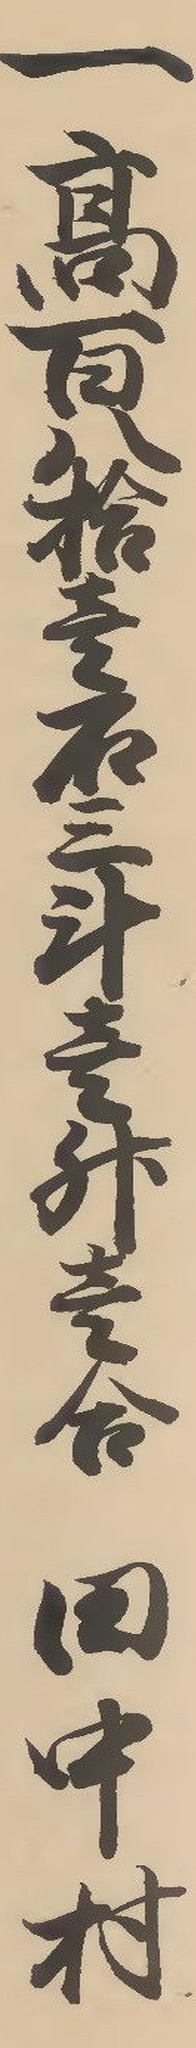一髙百八拾壱石三斗壱升壱合田中村
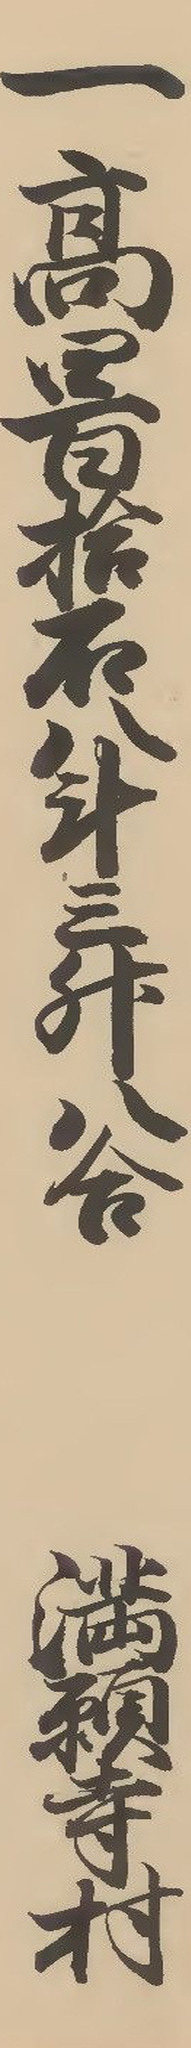一髙四百拾石八斗三升八合満願寺村
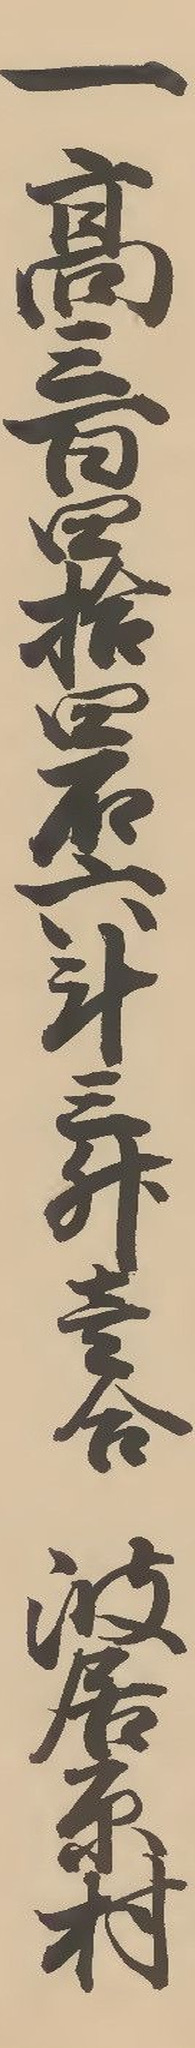一髙三百四拾四石六斗三升壱合波居原村
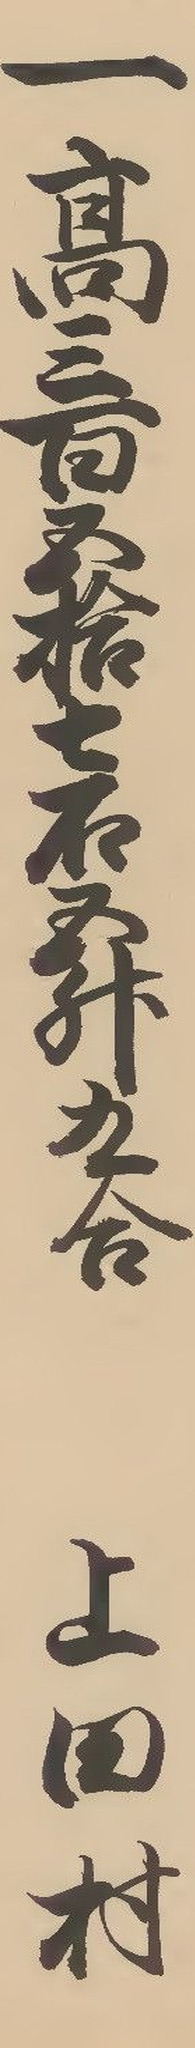一髙三百五拾七石五升九合上田村

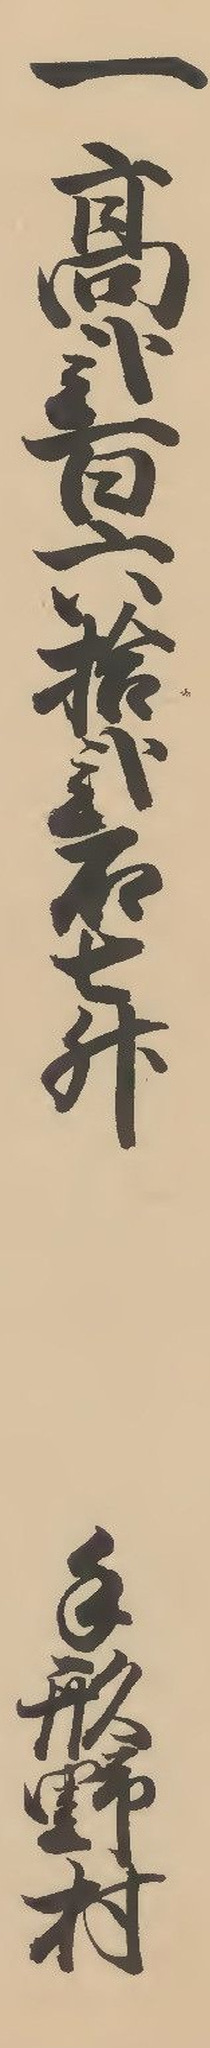一髙弐百六拾弐石七升手形野村
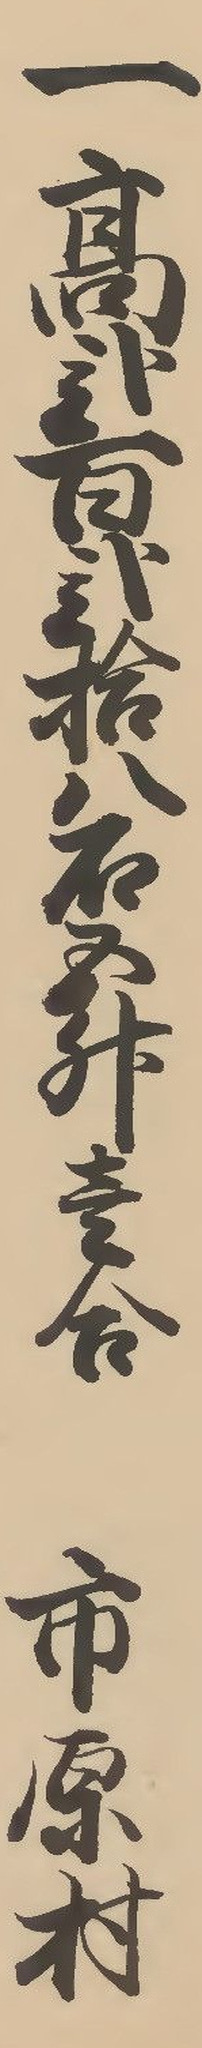一髙弐百弐拾八石五升壱合市原村
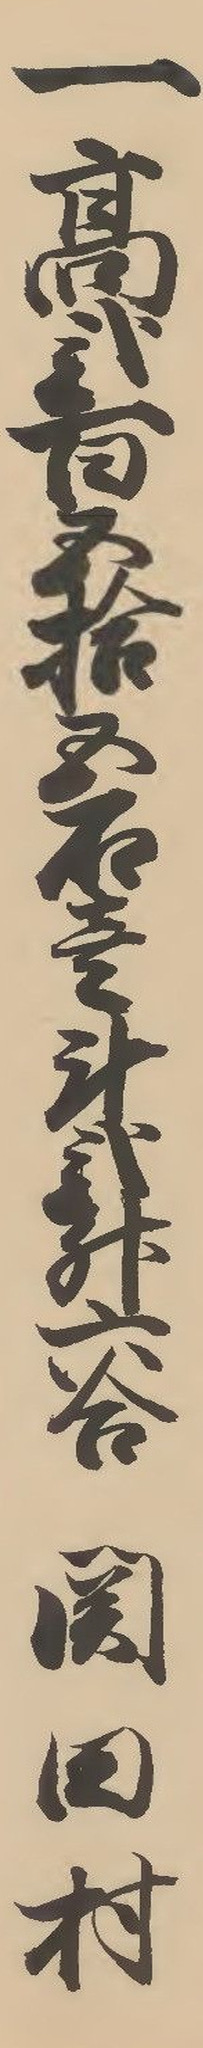一髙弐百五拾五石壱斗弐升六合関田村
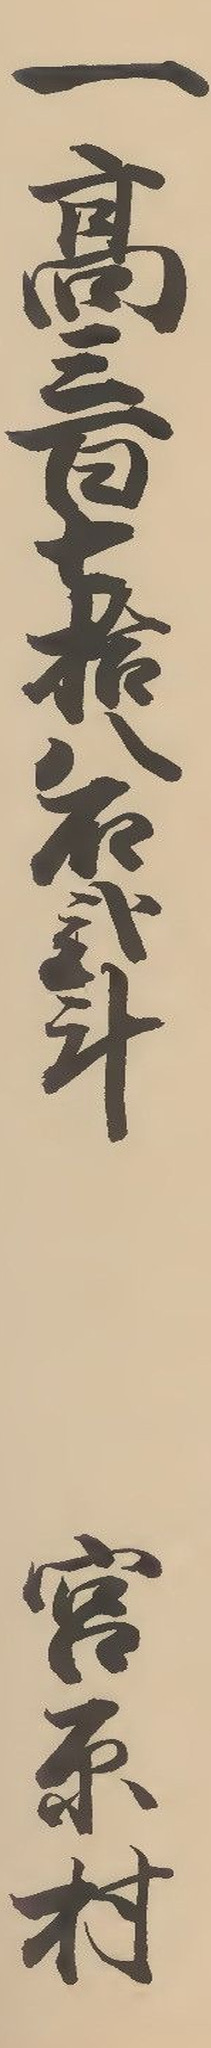一髙三百七拾八石弐斗宮原村
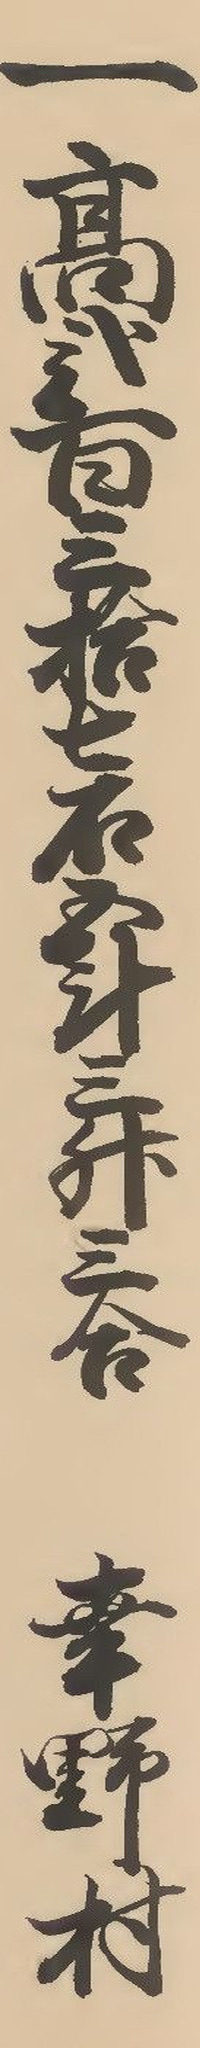一髙弐百三拾七石五斗三升三合幸野村
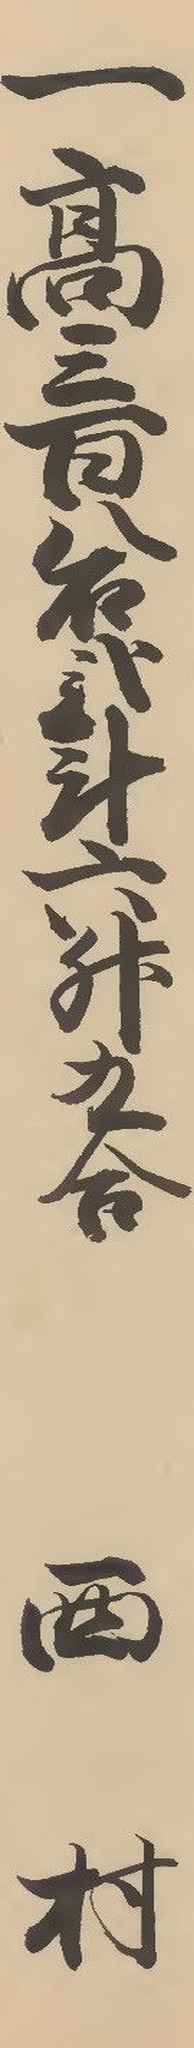一髙三百八石弐斗六升九合西村
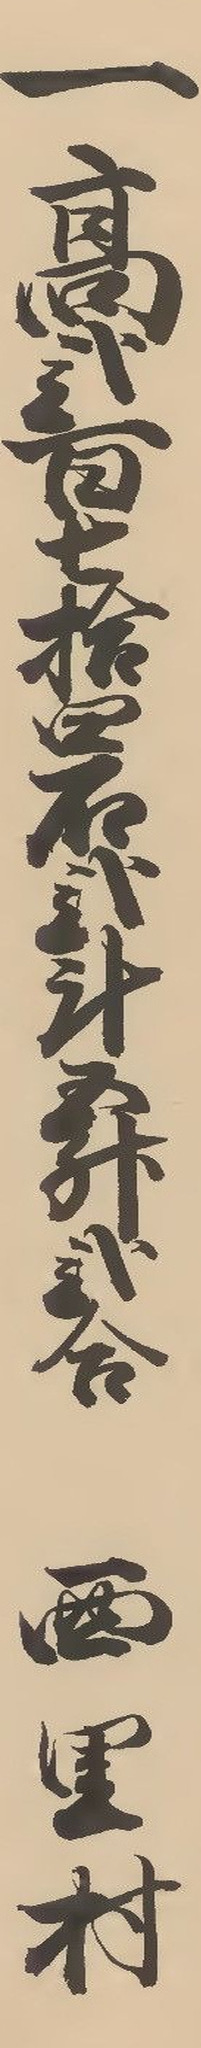一髙弐百七拾四石弐斗五升弐合西里村
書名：肥後国郷帳
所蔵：国立公文書館 National Archives of Japan
